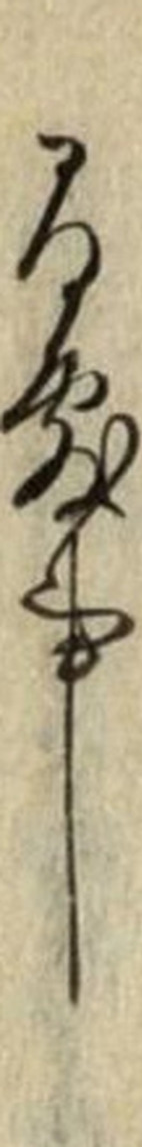間敷事
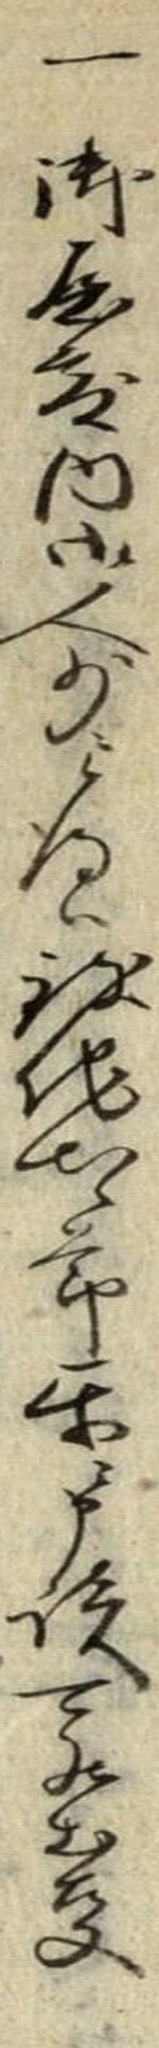一御屋敷内御人少ニ候得ハ致他出候節互ニ申談可罷出事
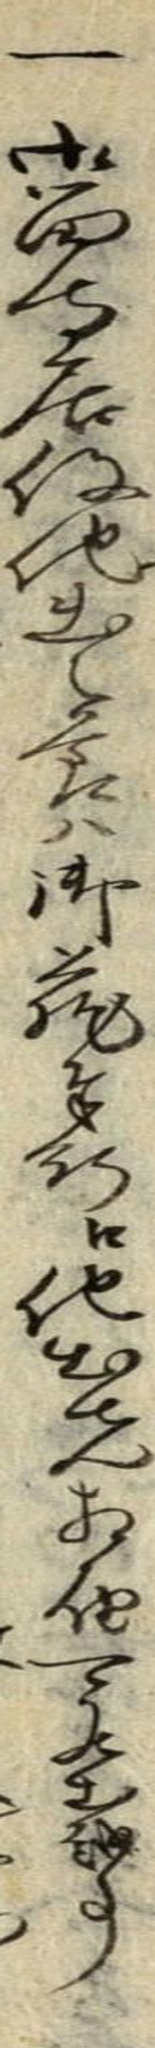一御留守居役他出之節ハ御蔵奉行江他出先相届可罷出越事
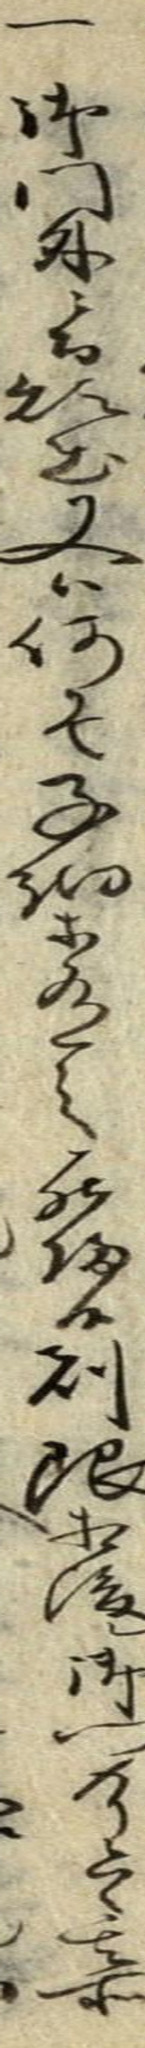一御門外ニ而煩出又ハ何そ子細等有之罷帰候刻限相後レ御門〆り候ハヽ其所
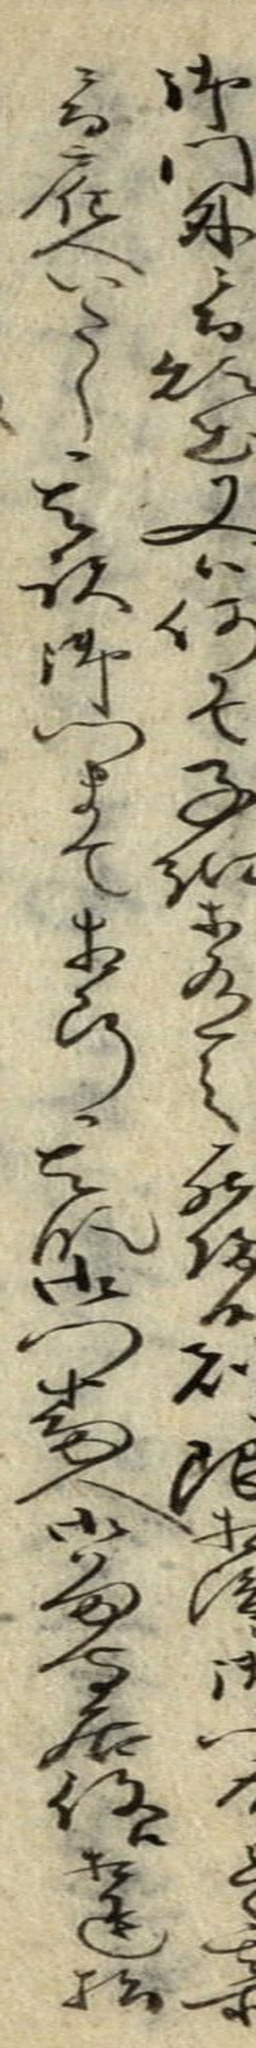ニ而雇人いたし其訳御門まて相断候其段御門番人御留守居役江相達指
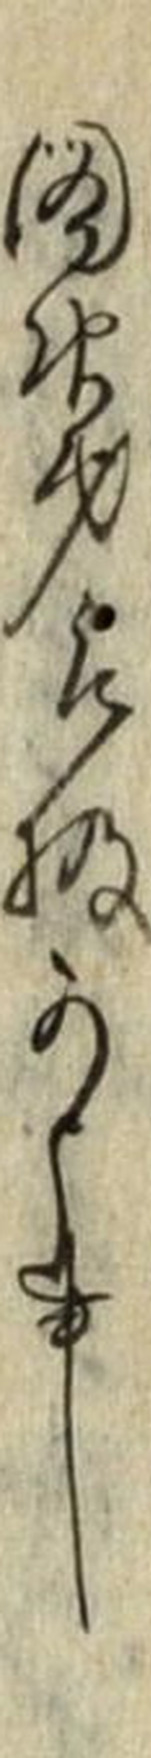図次第取扱可申事
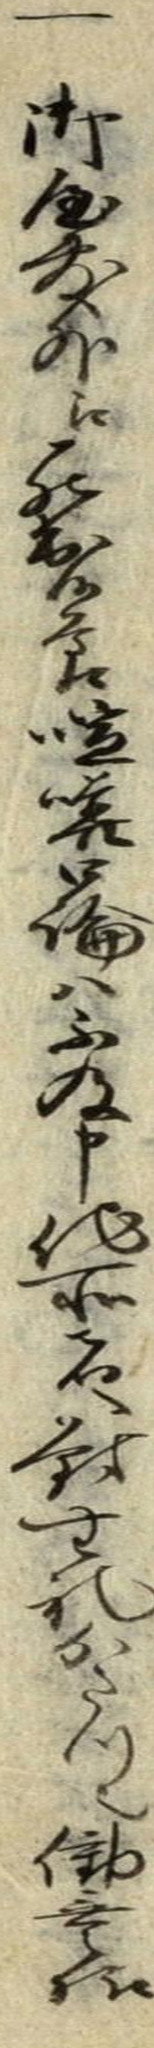一御屋敷外江罷出候節喧嘩口論ハ不及申他所者へ対無礼かさつ之働無之様
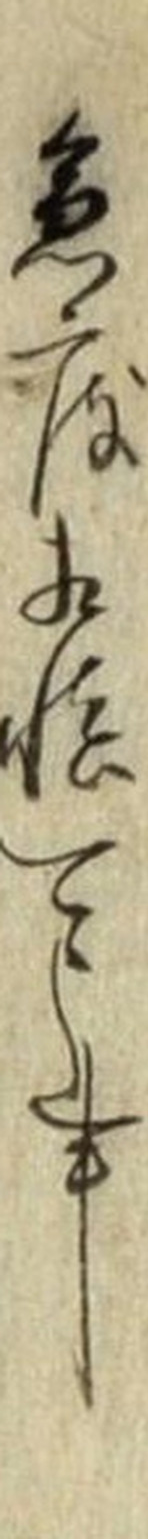急度相慎可申事
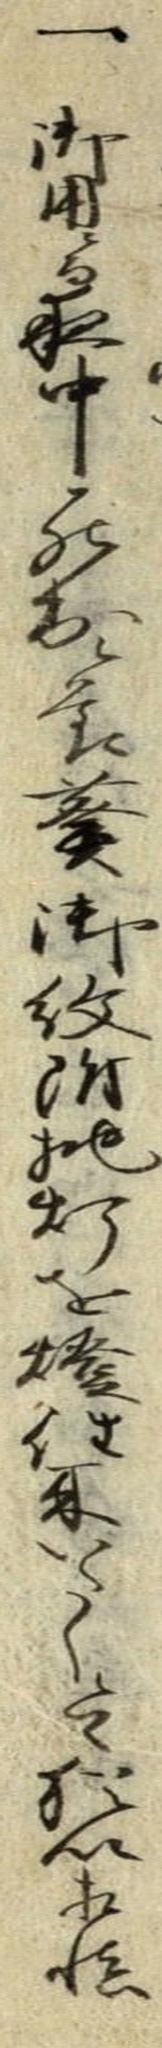一御用ニ而夜中罷出候節葵御紋附挑灯を灯往来いたし候ハヽ猶以相慎
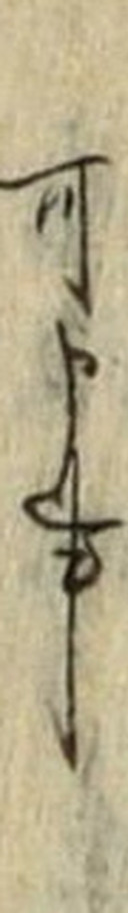可申事
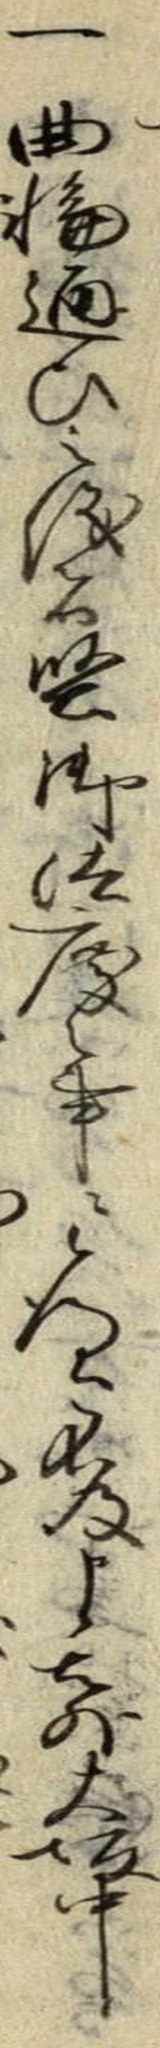一曲輪通ひ之儀者堅御法度之事ニ候得ハ不及申其外大坂中
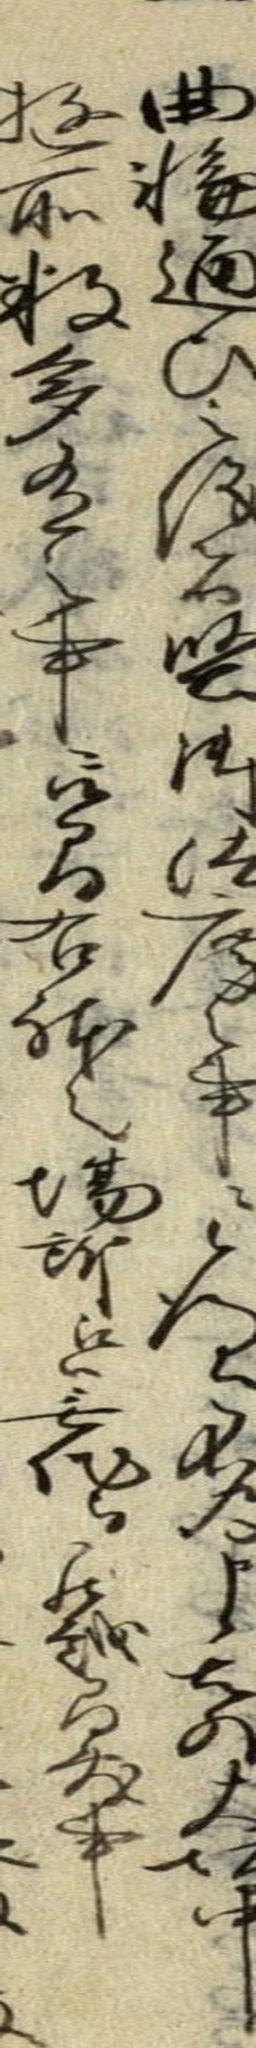遊所数多有之事ニ候間右体之場所江ハ無作与罷越間敷事
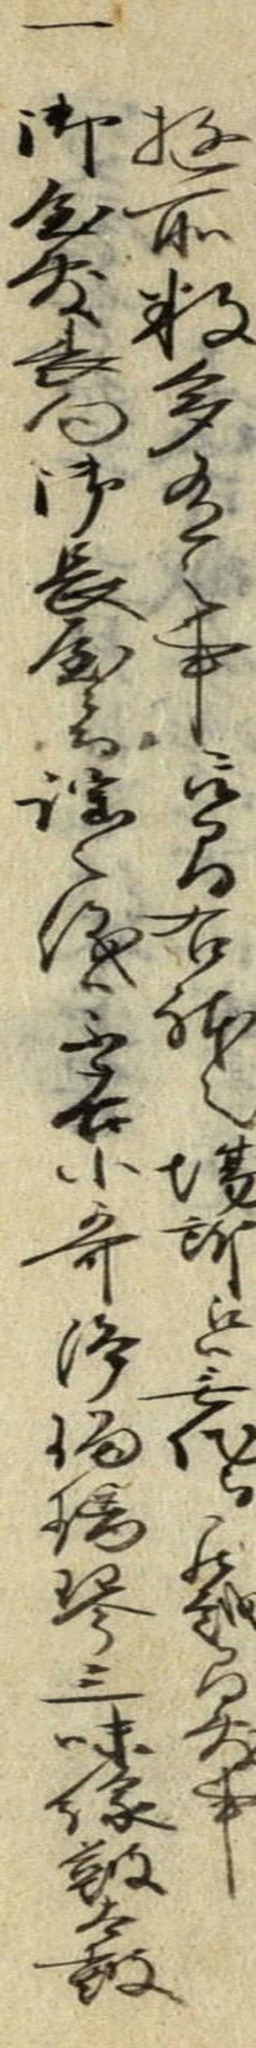一御屋敷表向御長屋ニ而謡之儀ハ不苦小歌浄瑠璃琴三味線鞁太鼓
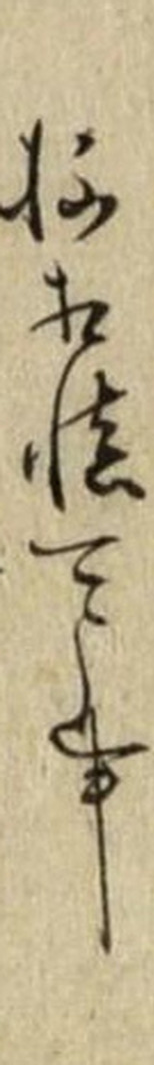等相慎可申事
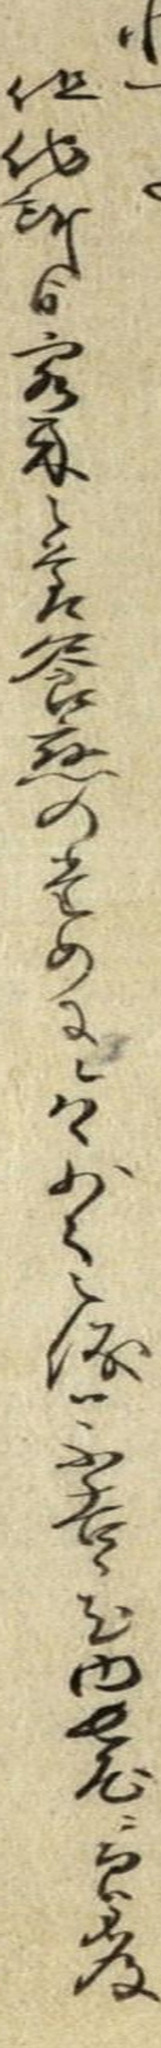但他所ゟ客来候節饗応のために候ハヽ少々之儀ハ不苦候尤内長屋ニ而ハ不及
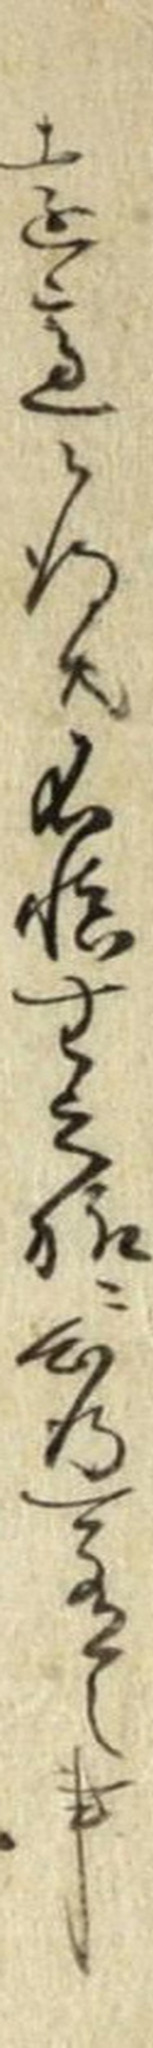遠慮候得共不慎無之様ニ心得可有之事
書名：三都并道中之部
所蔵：福井県文書館 Fukui Prefectural Archives
